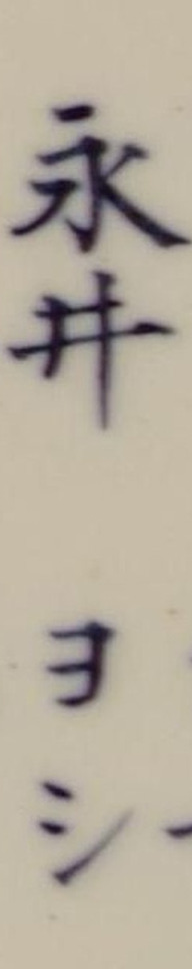永井ヨシ
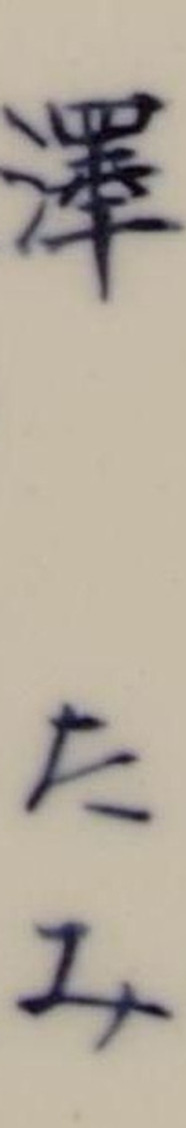澤たみ
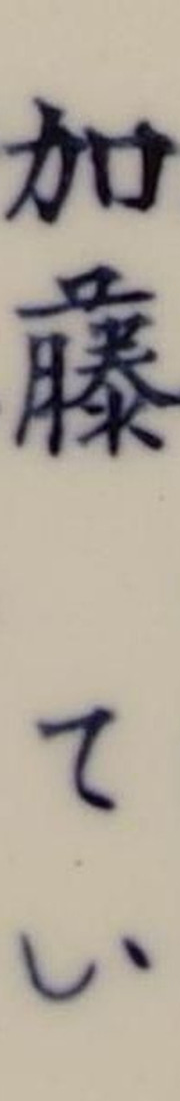加藤てい
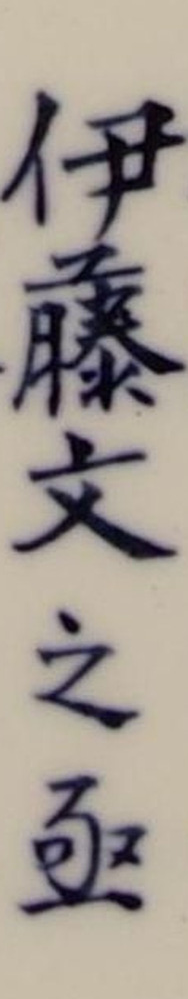伊藤文之丞
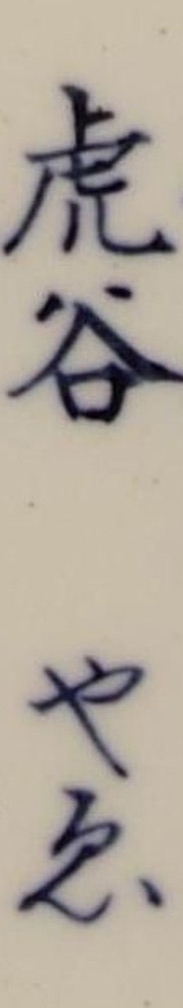虎谷やえ
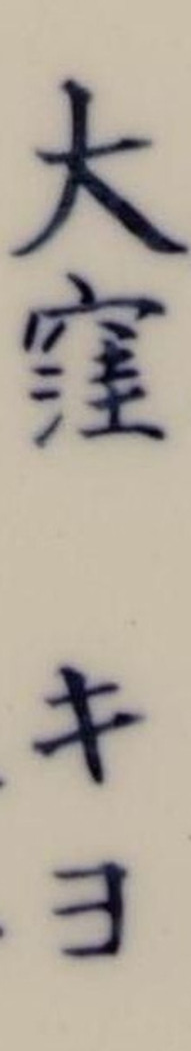大窪キヨ
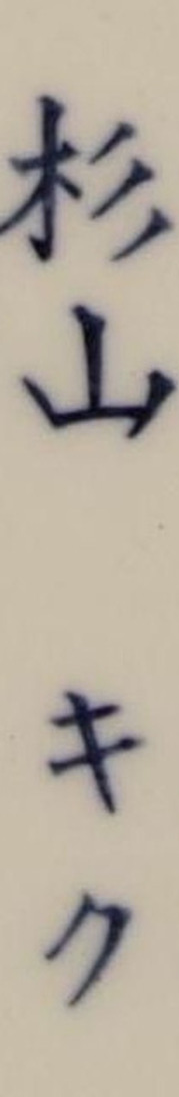杉山キク
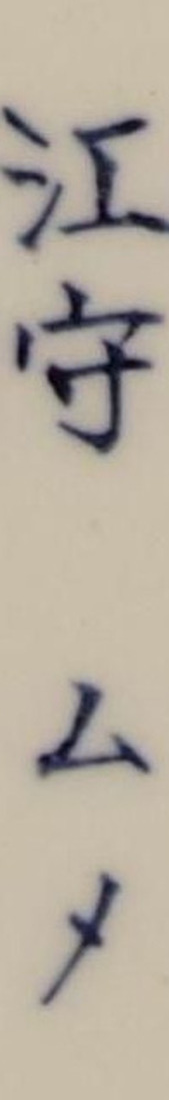江守ムメ
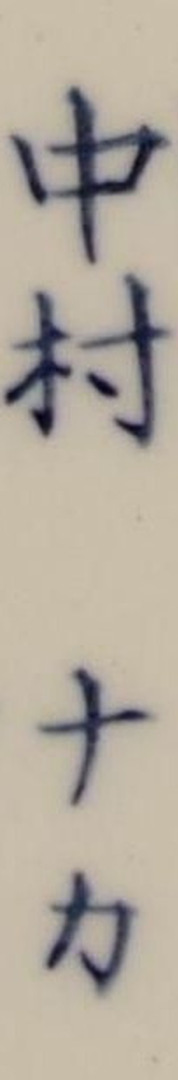中村ナカ
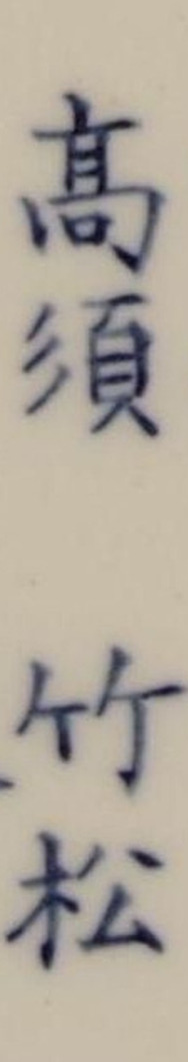高須竹松
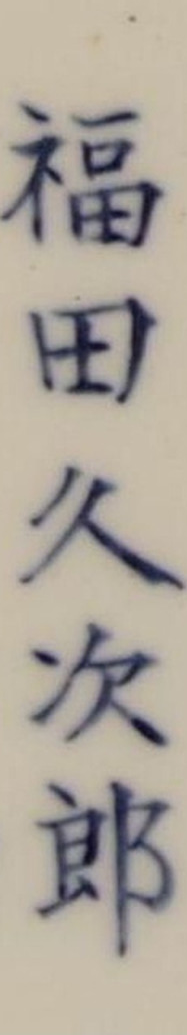福田久次郎

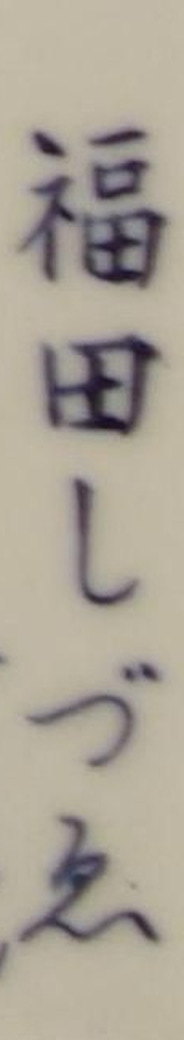福田しづえ
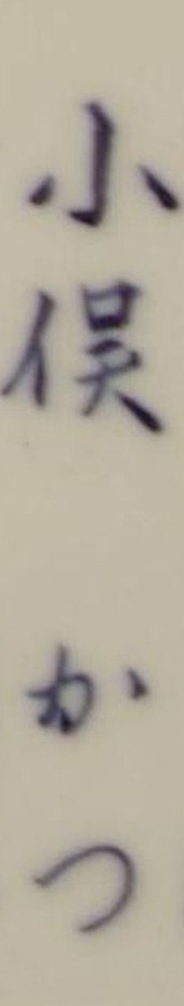小俣かつ
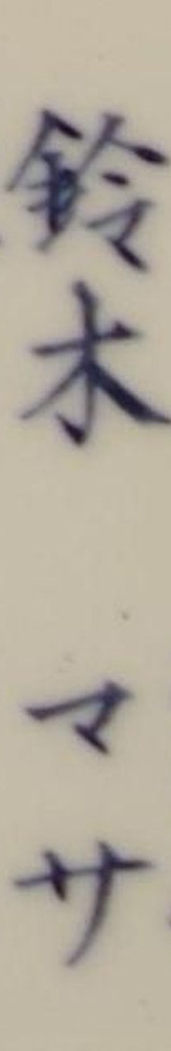鈴木マサ
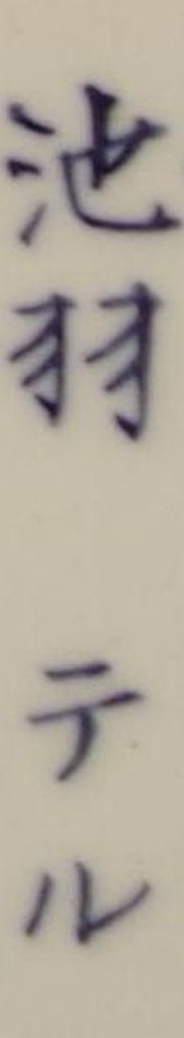池羽テル
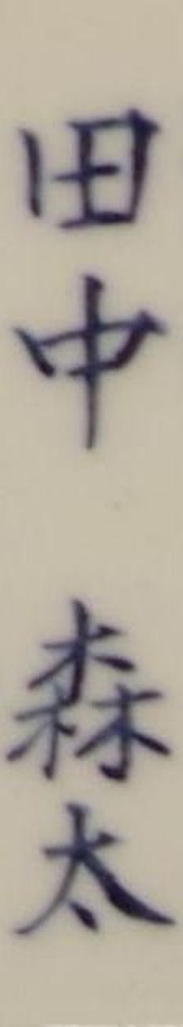田中森太
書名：E~L
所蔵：高野山金剛峯寺
